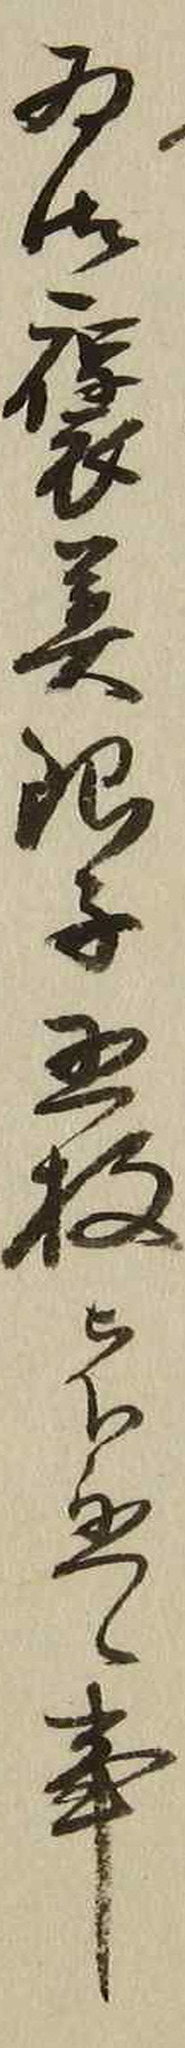為御褒美銀子五枚被下置候事
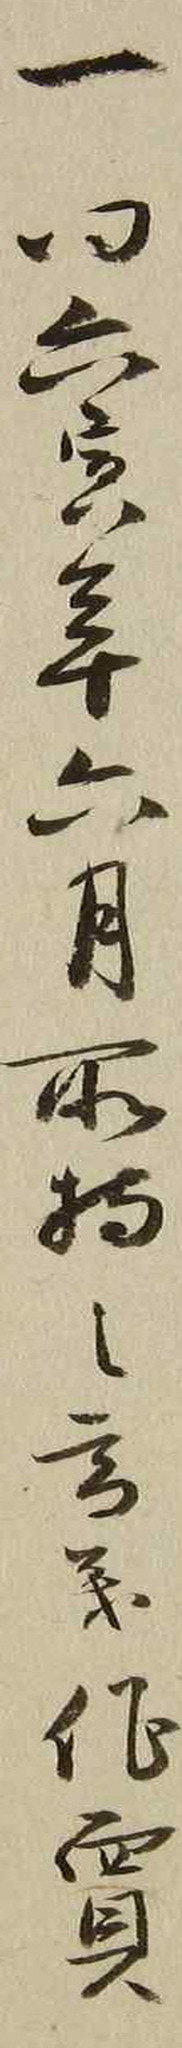一同六寅年六月所持之高義作面具
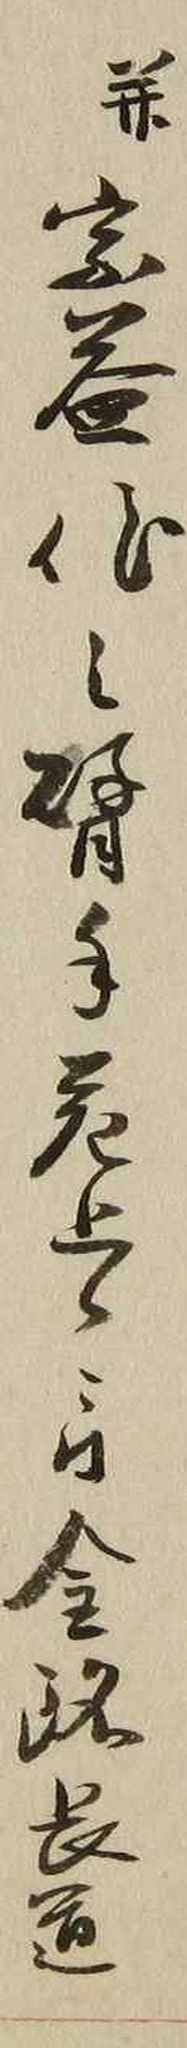并宗益作之臂手差上候に付金銘長通
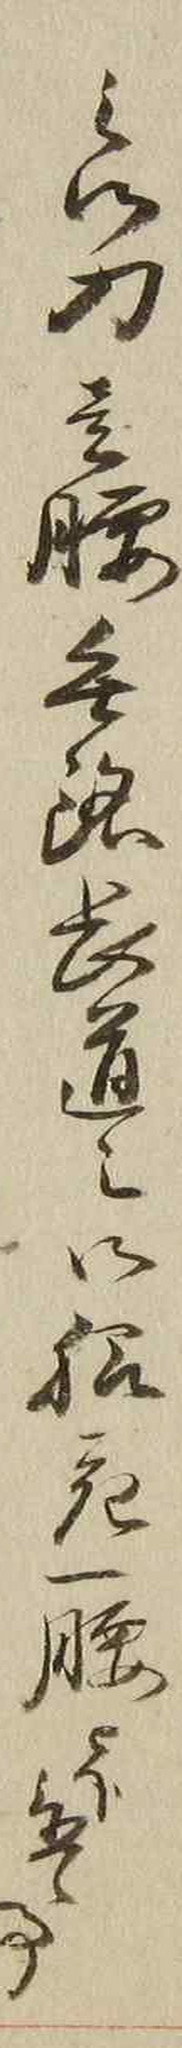之御刀井壱腰無銘長通之御脇差一腰被下置候事
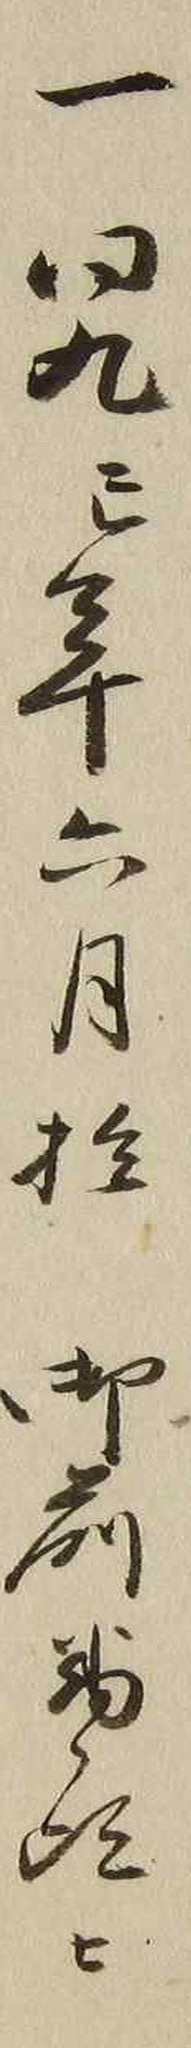一同九巳年六月於御前番頭被
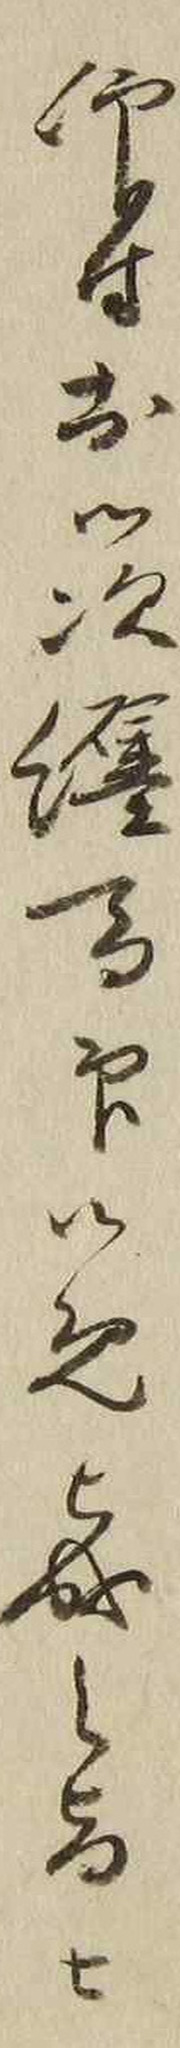仰付於御次纒馬印御免被成候旨被
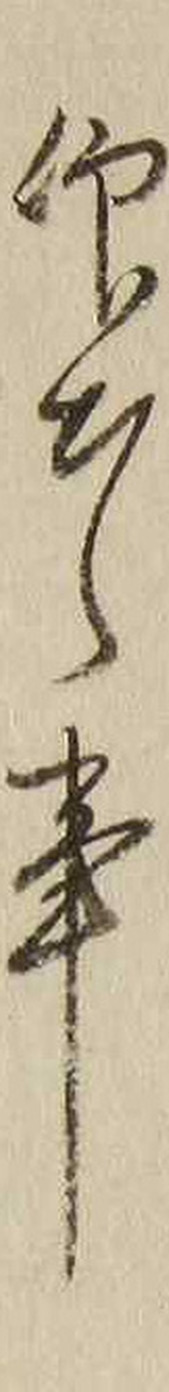仰出候事
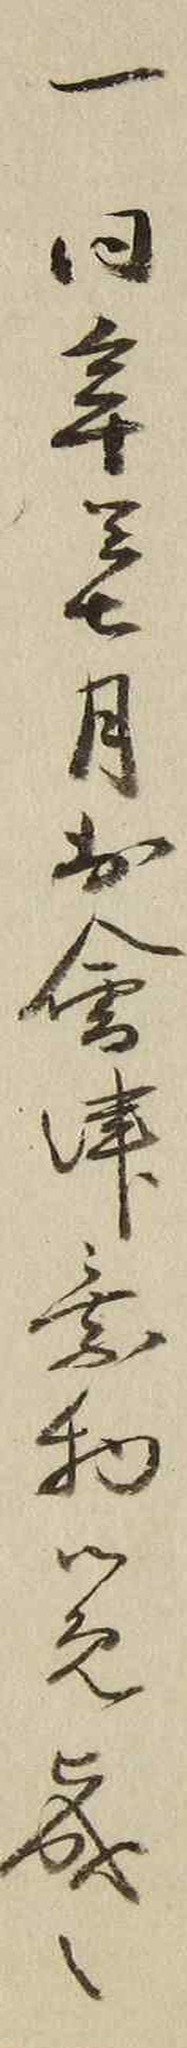一同年閏七月於会津乗物御免被成候
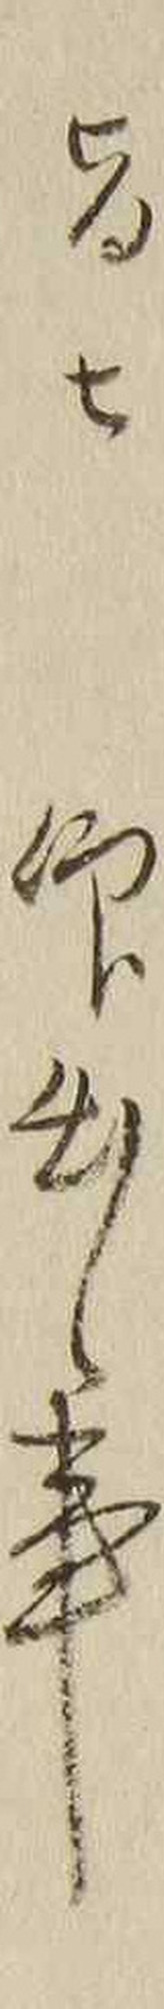旨被仰出候事
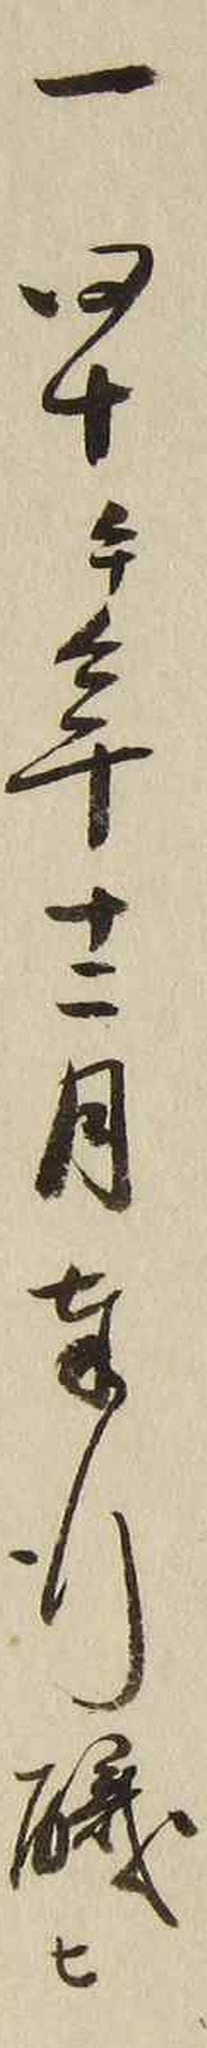一同十午年十二月奉行職被
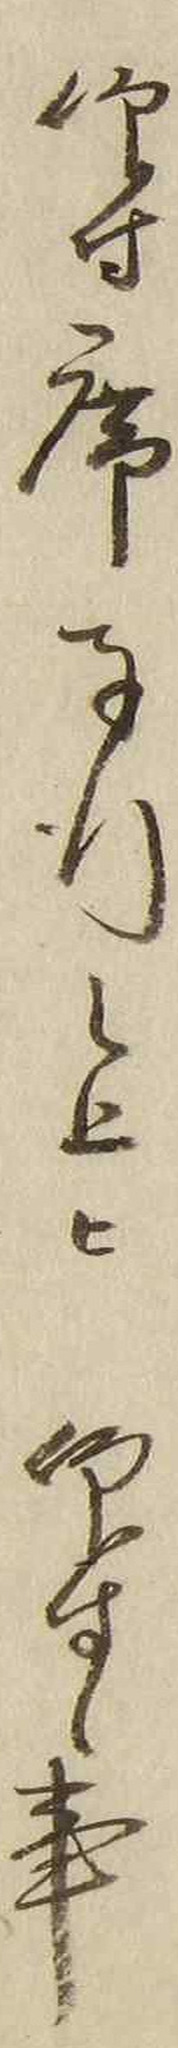仰付席奉行之上被仰付候事

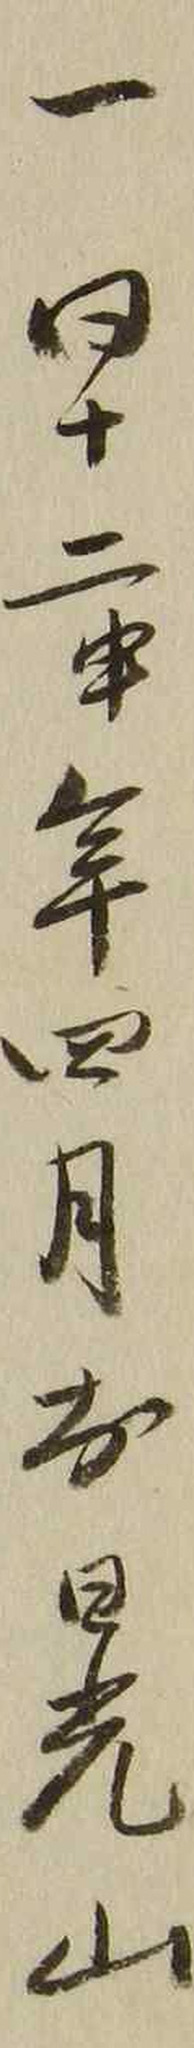一同十二申年四月於日光山
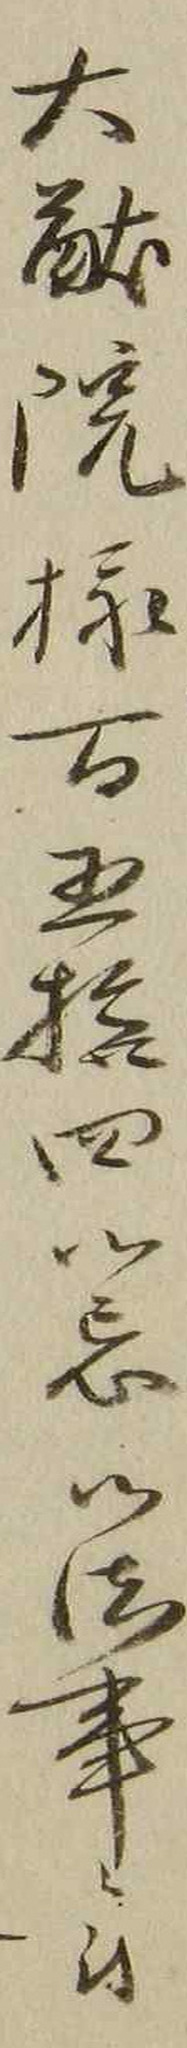大猷院様百五拾回御忌御法事に付
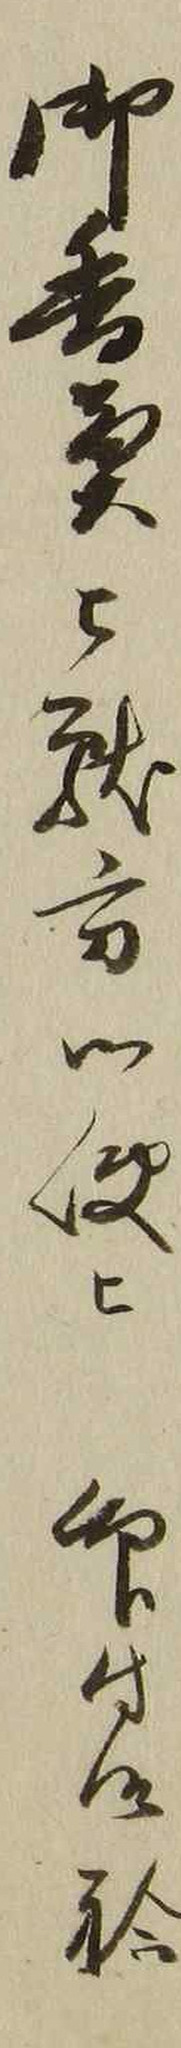御香典御献方御役被仰付御袷
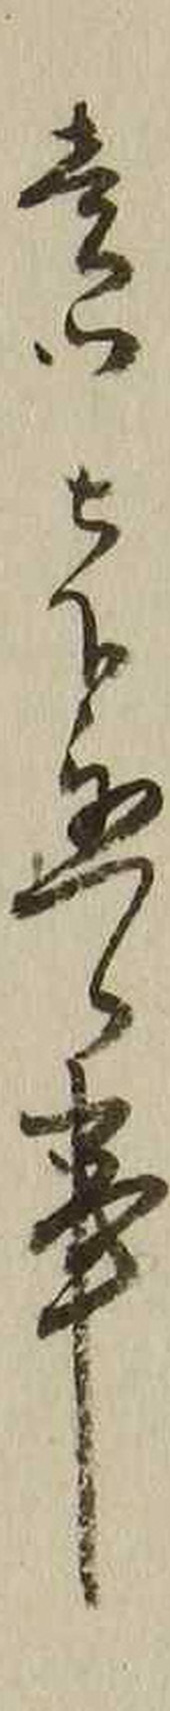壱つ被下置候事
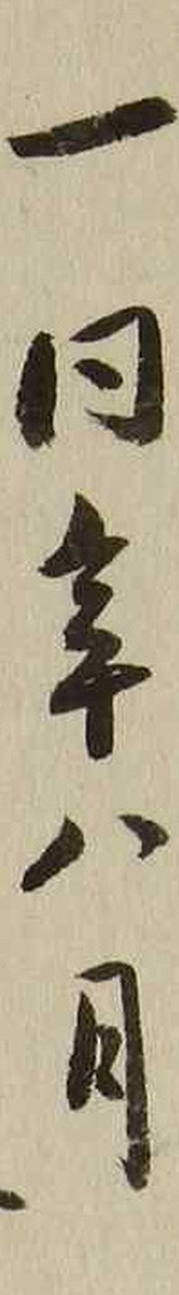一同年八月
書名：諸士系譜　巻之269　さ之部1
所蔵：会津若松市立会津図書館
